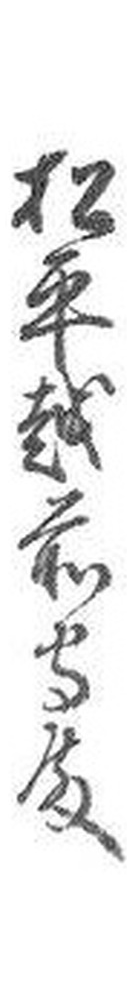松平越前守殿
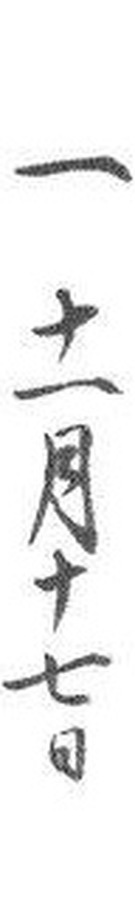一十一月十七日
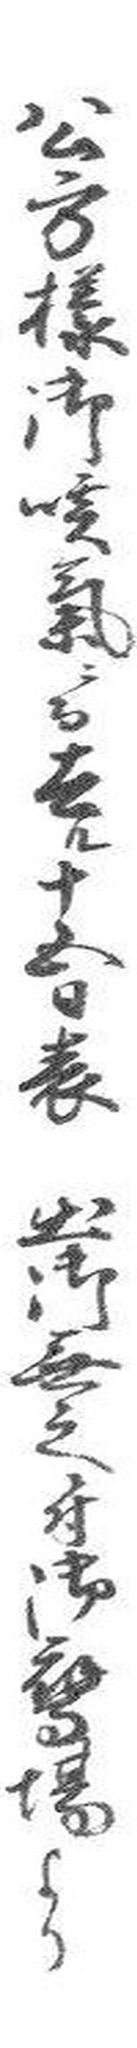公方様御咳気ニ而去ル十五日表出御無之ニ付御鷹場より
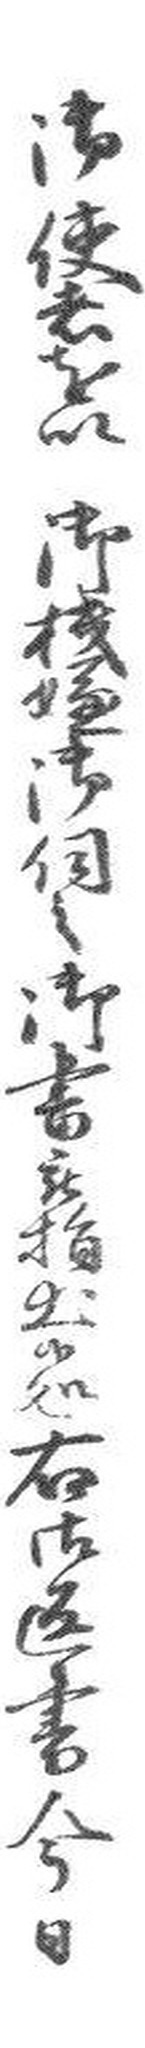御使者を以御機嫌御伺之御書被指出候処右御返書今日
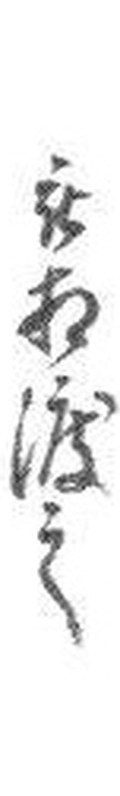被相渡之
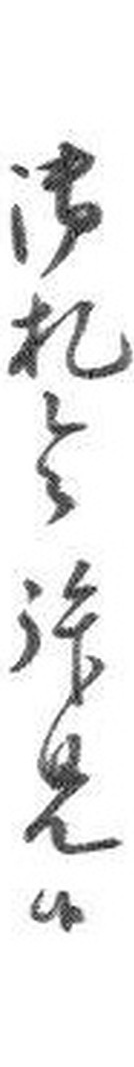御札令拝見候
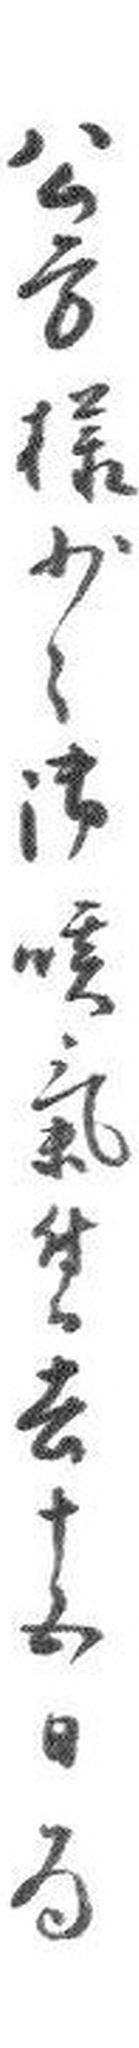公方様少々御咳気付而去十五日為
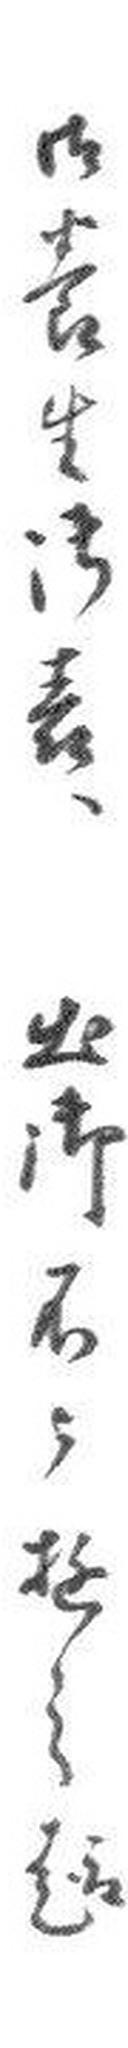御養生御表ヘ出御不被遊之趣
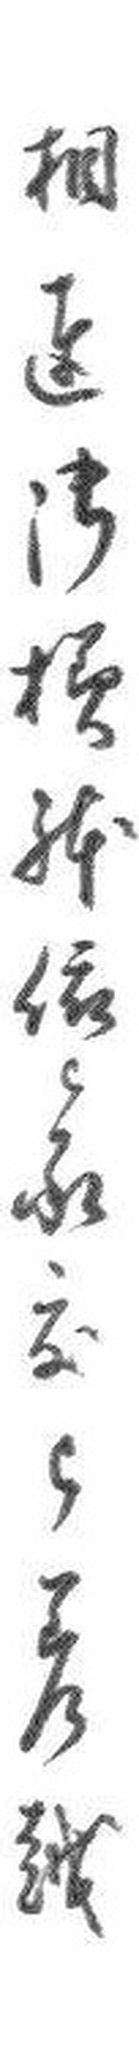相達御様体依被承度被差越
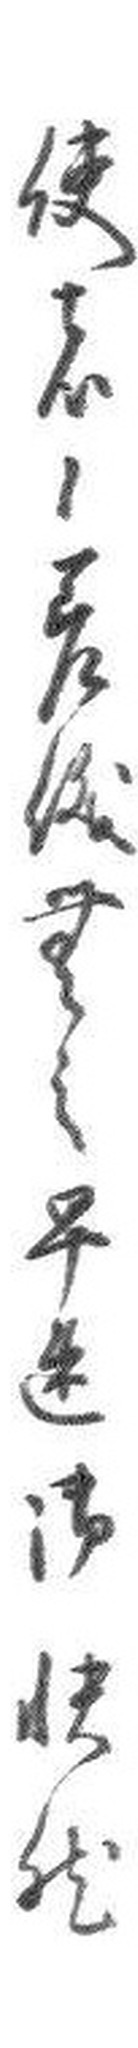使者候差儀無之早速御快然
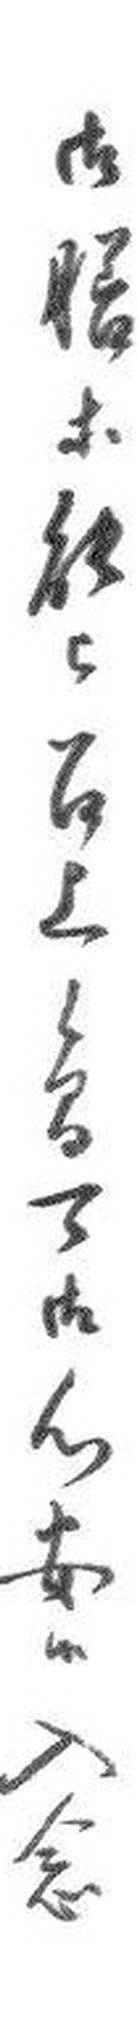御膳等能被召上候間可御心安候入念
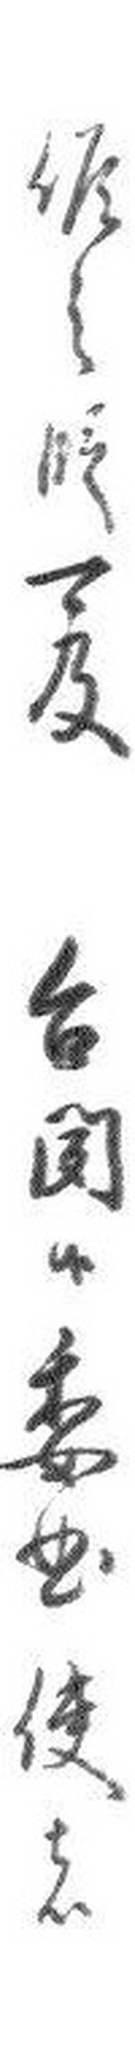候之段可及台聞候委曲使者
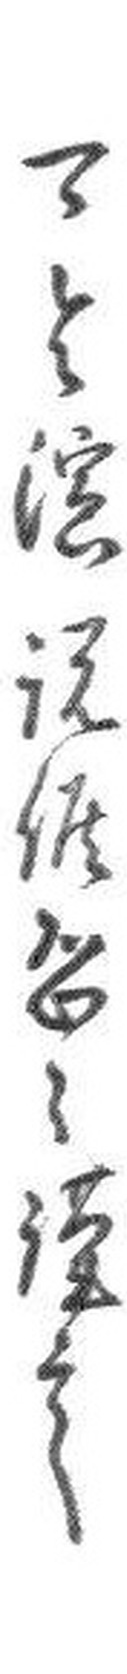可令演説候恐々謹言
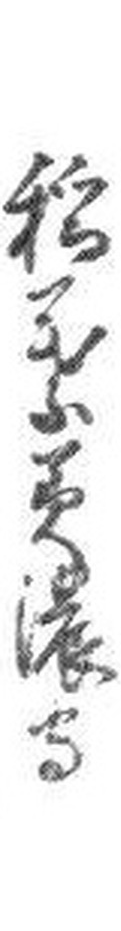稲葉美濃守
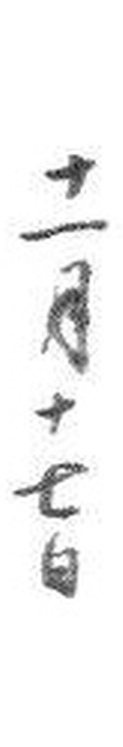一十一月十七日

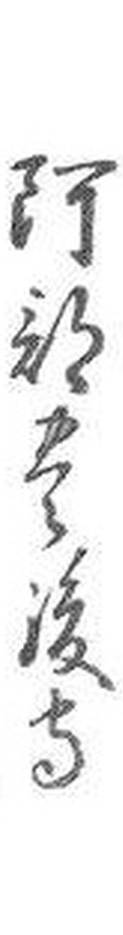阿部豊後守
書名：家譜 六 光通公 従万治三年到寛文三年
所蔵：福井県文書館 Fukui Prefectural Archives
